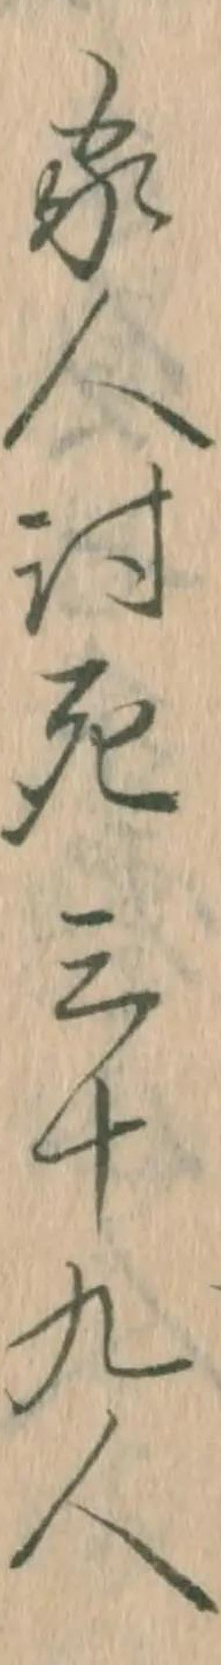家人討死三十九人
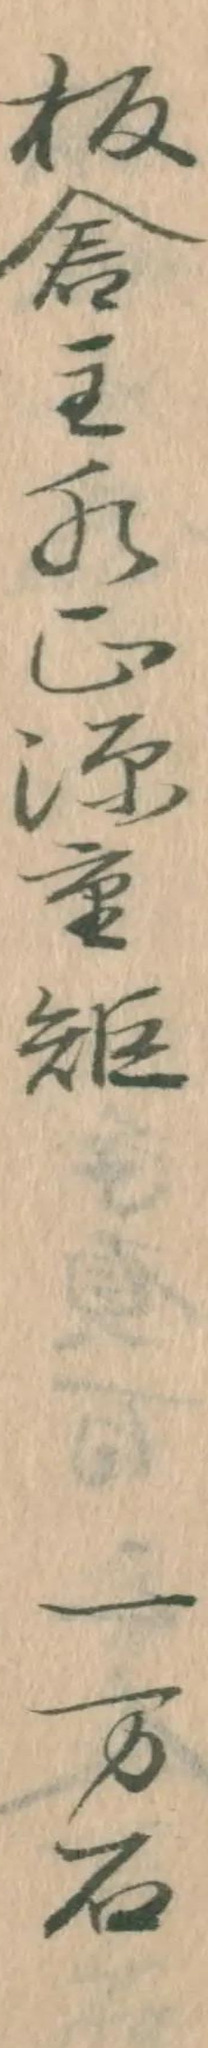板倉主水正源重矩一万石
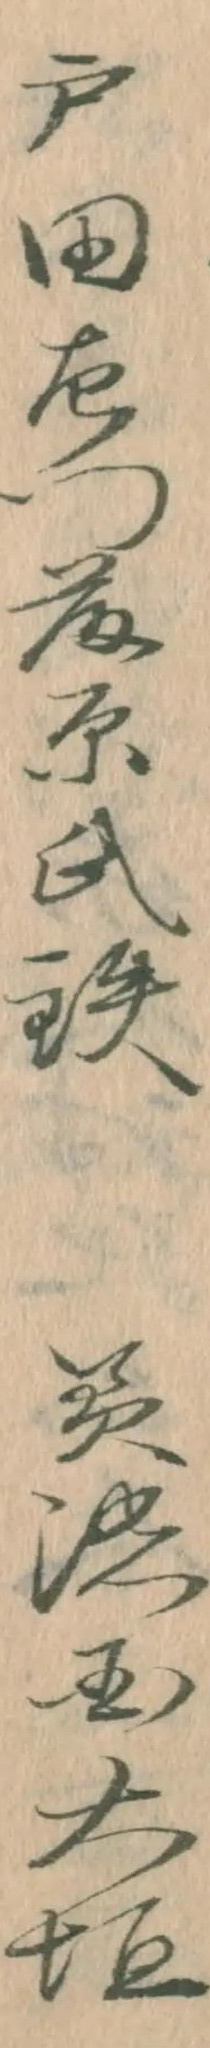戸田左門藤原氏鉄美濃国大垣
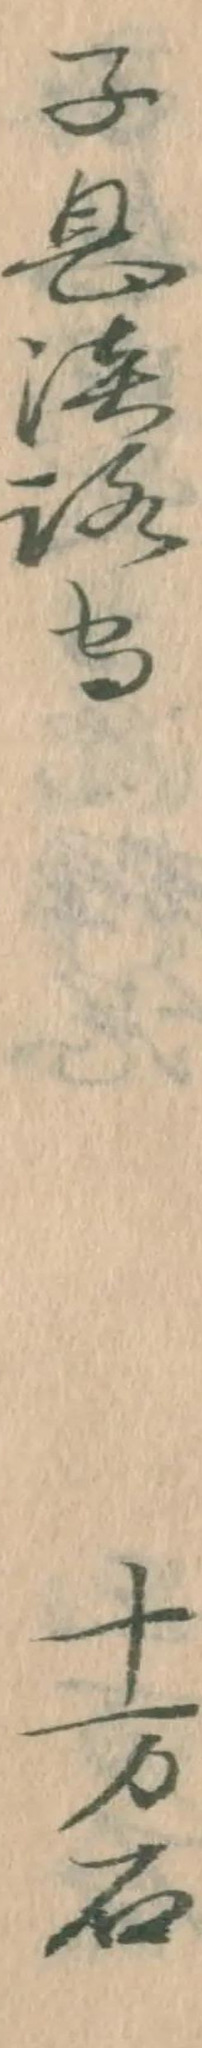子息淡路守十万石
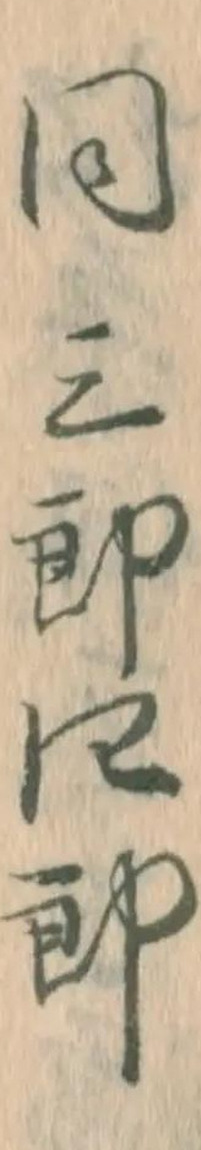同三郎四郎
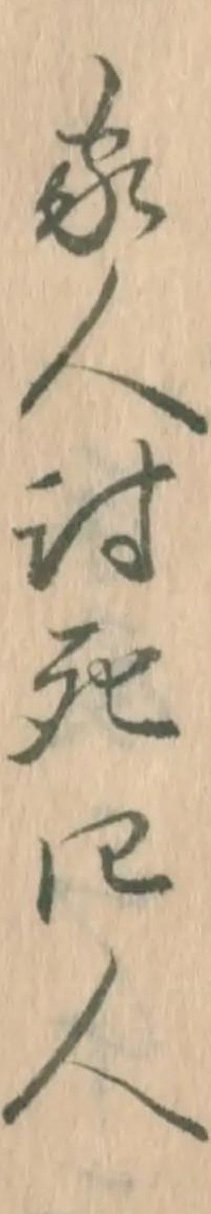家人討死四人

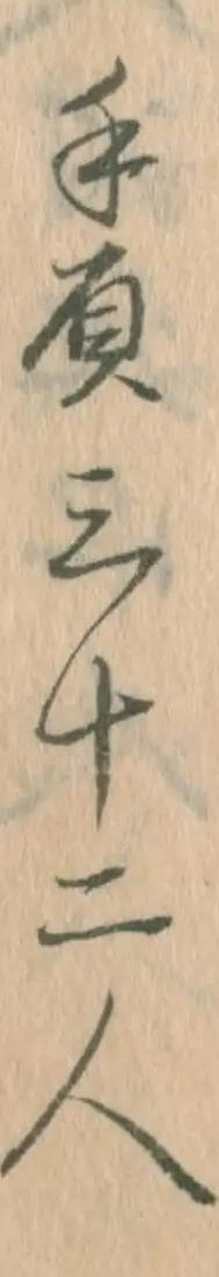手負三十二人
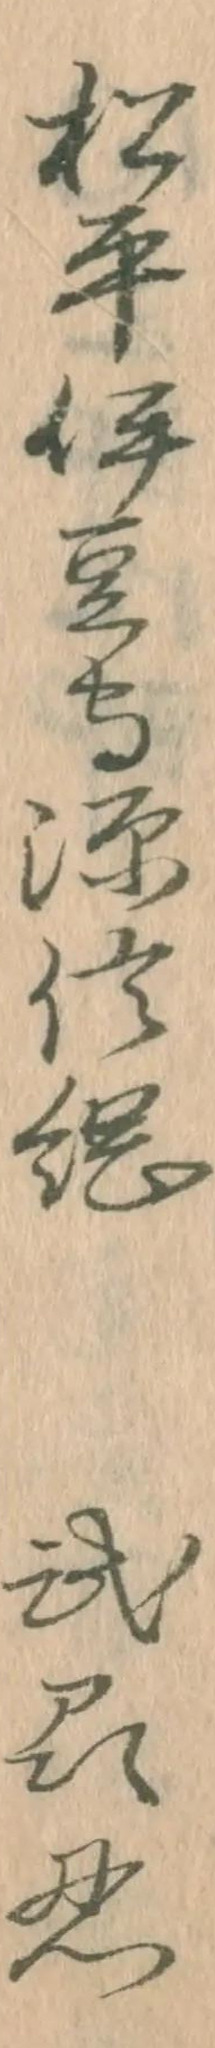松平伊豆守源信綱武州忍
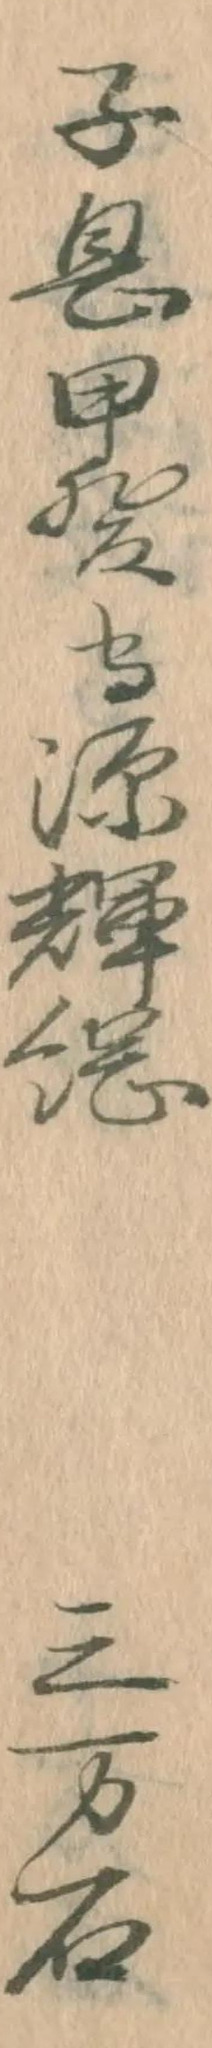子息甲斐守源輝綱三万石
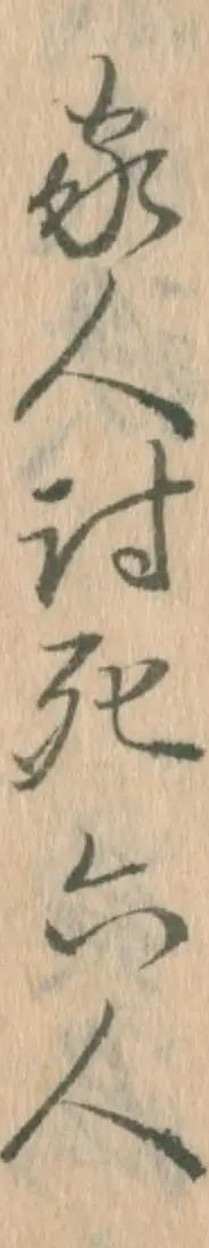家人討死六人
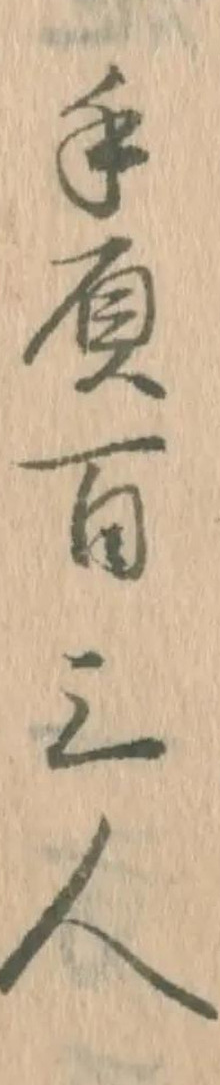手負百三人
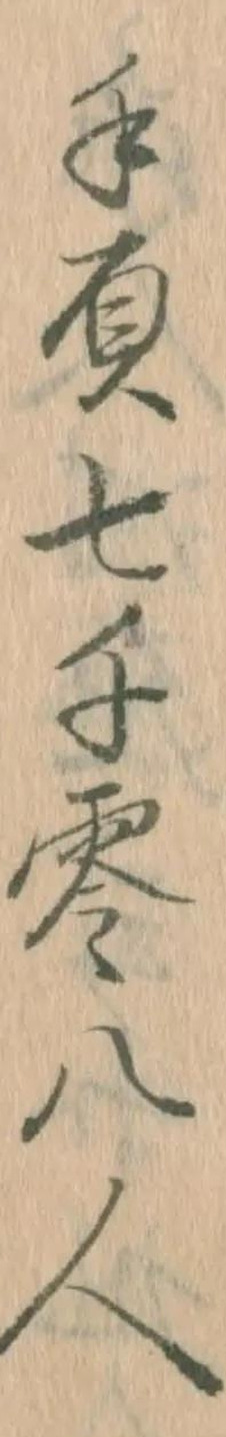手負七千礼零八人
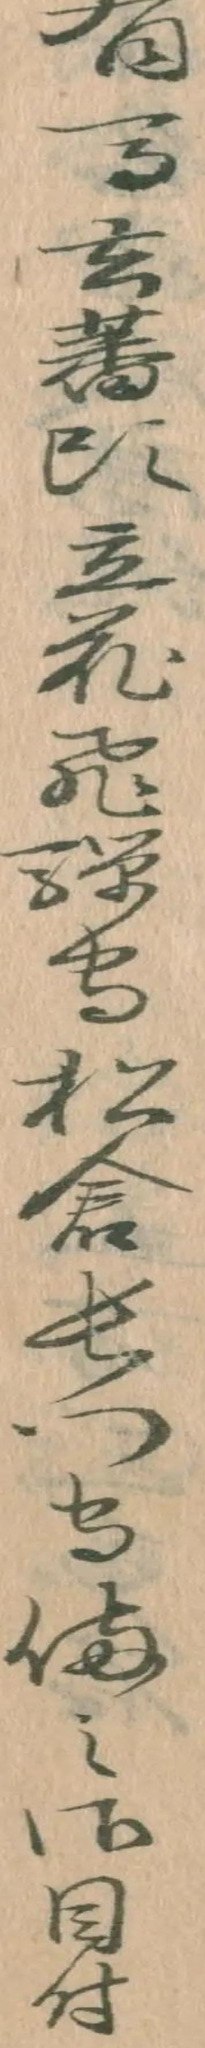有馬玄蕃頭立花飛騨守松倉長門守備之御目付
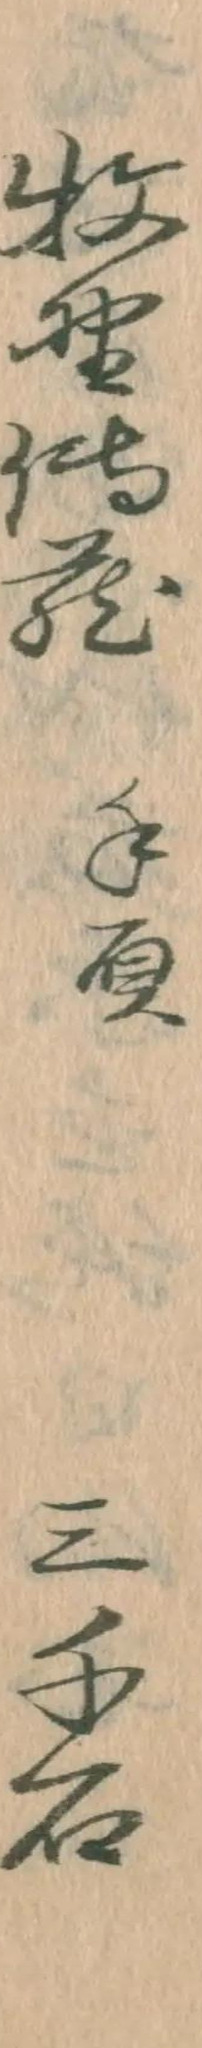牧野伝蔵手負三千石
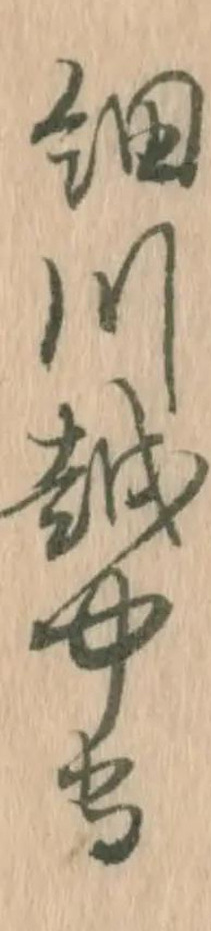細川越中守
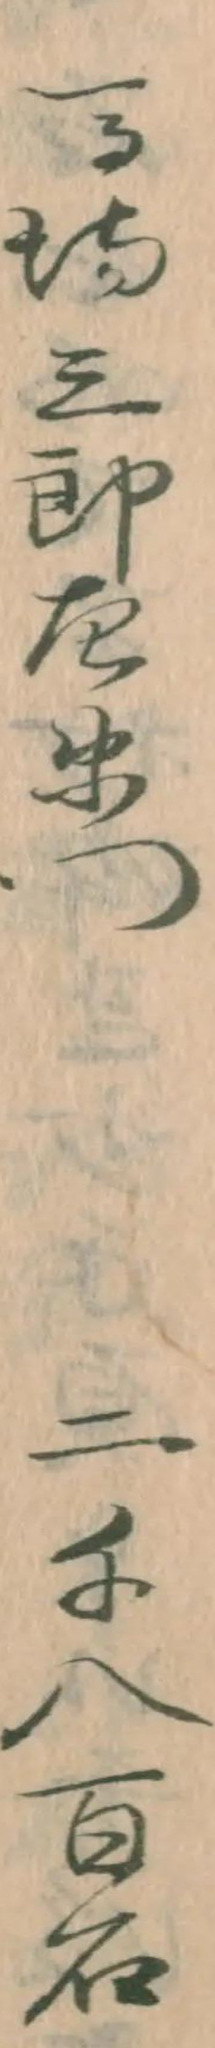馬場三郎左衛門二千八百石
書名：切支丹御退治記 49巻. [9]
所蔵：国立国会図書館 National Diet Library, JAPAN
